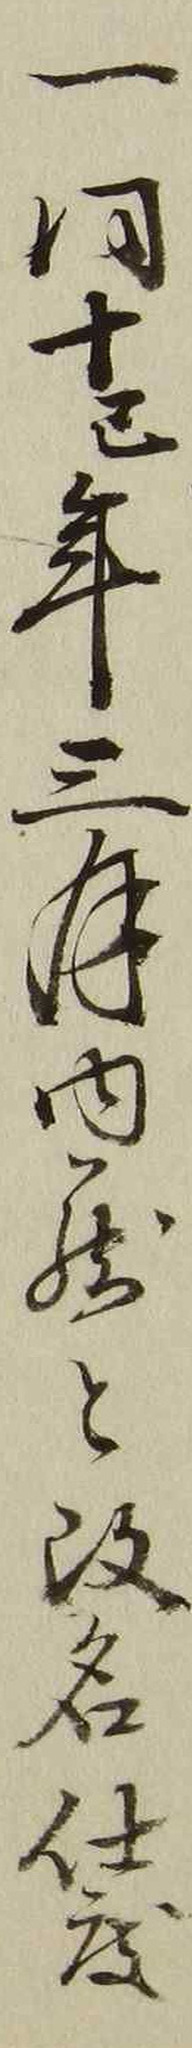一同十巳年三月内蔵と改名仕度
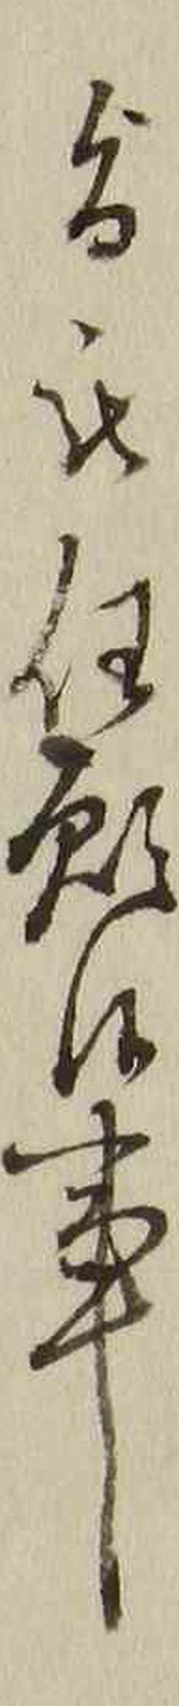旨被任願候事
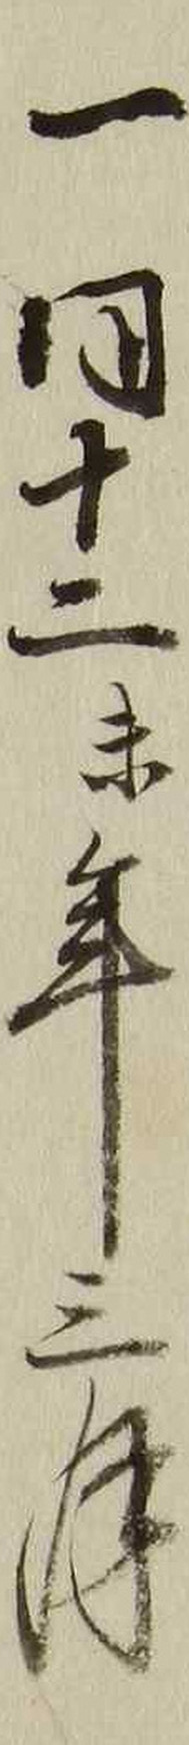一同十二未年三月
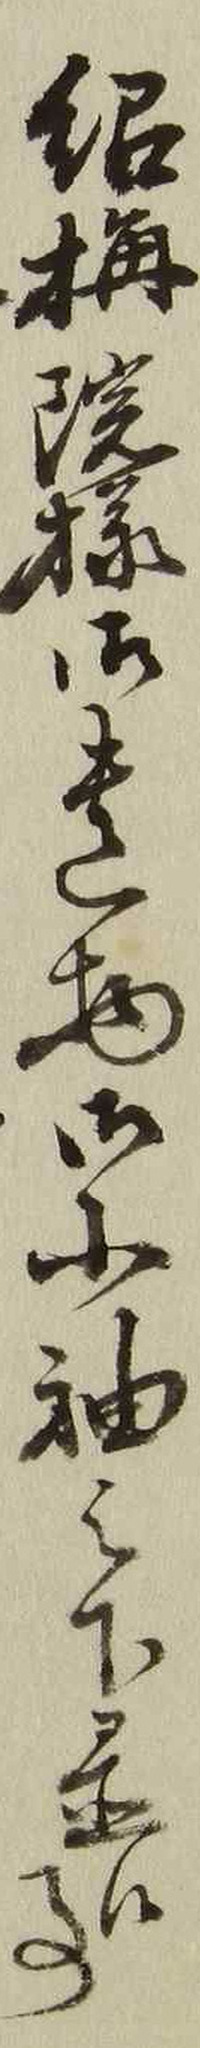紹栴院様御遺物御小袖被下置候事
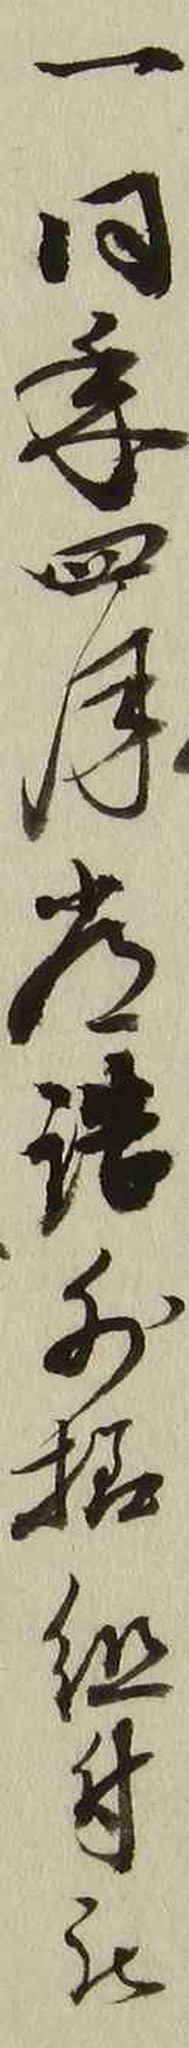一同年四月常詰外様組付被
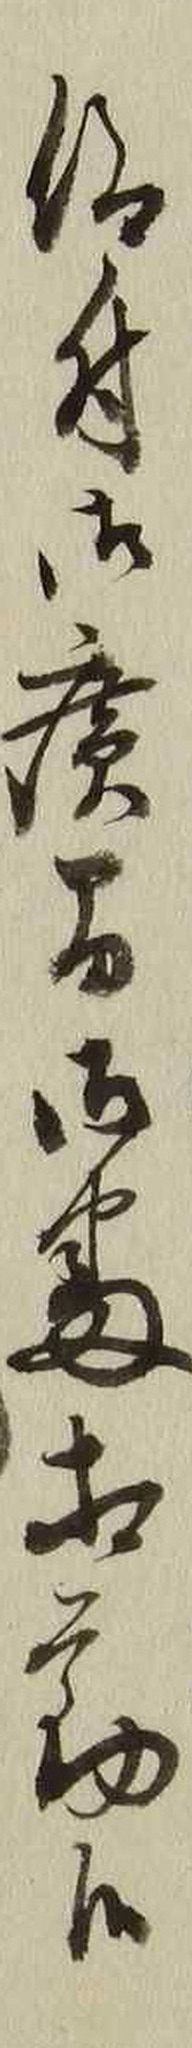仰付御広間御番相勤候
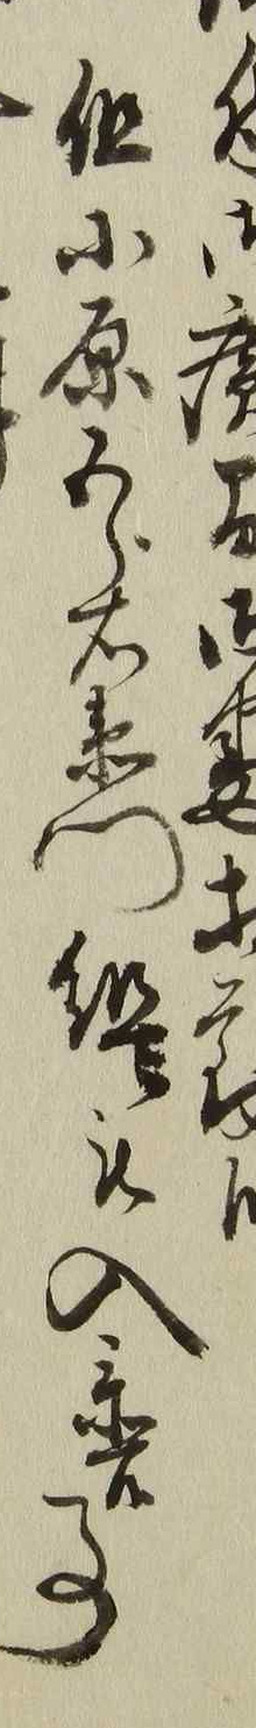但小原五郎右衛門組ニ被入置候事
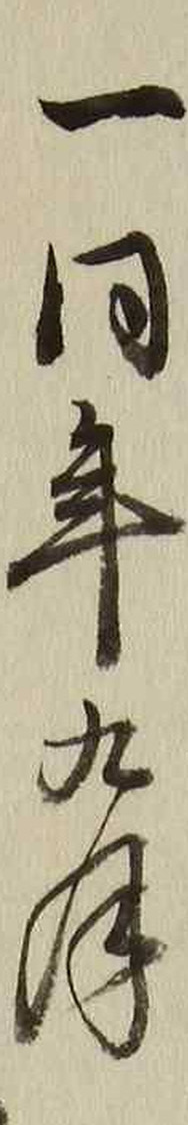一同年九月
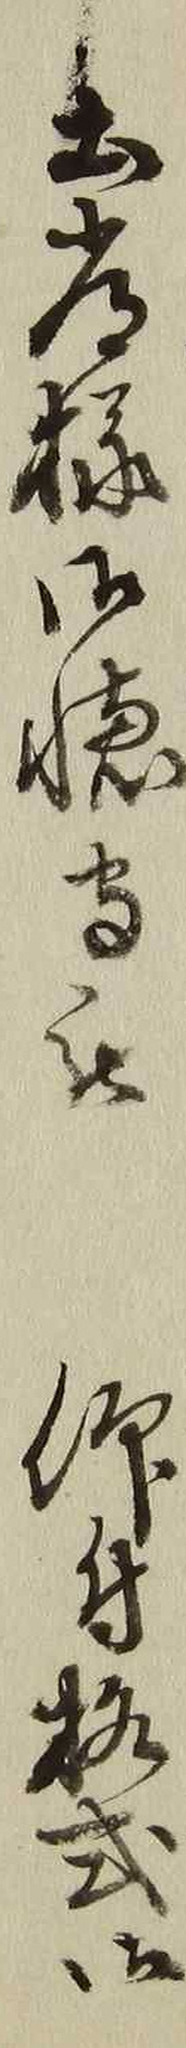土常様御懐守被仰付格式御
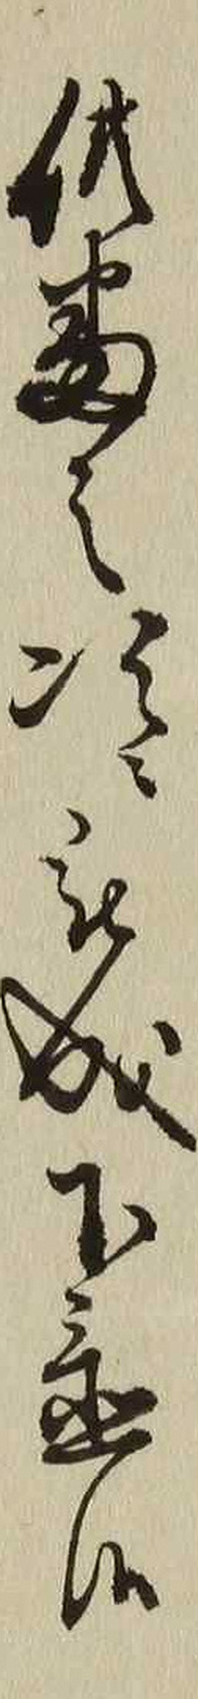供番之次ニ被成下置候
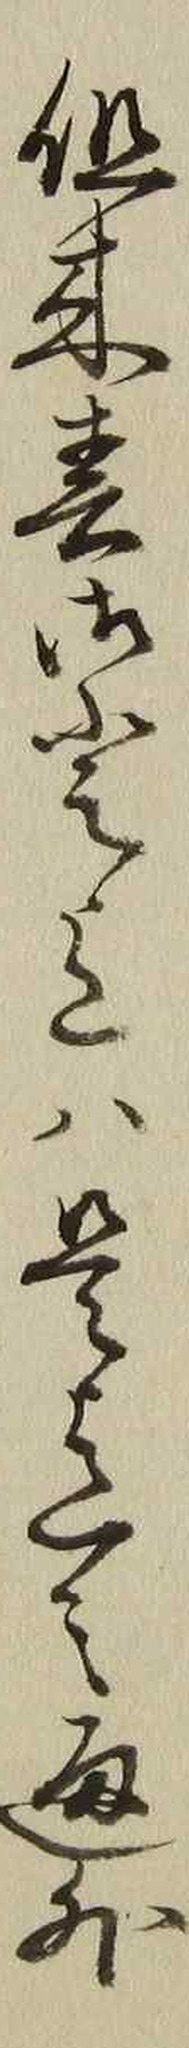但来春御登迄ハ是迄之通外
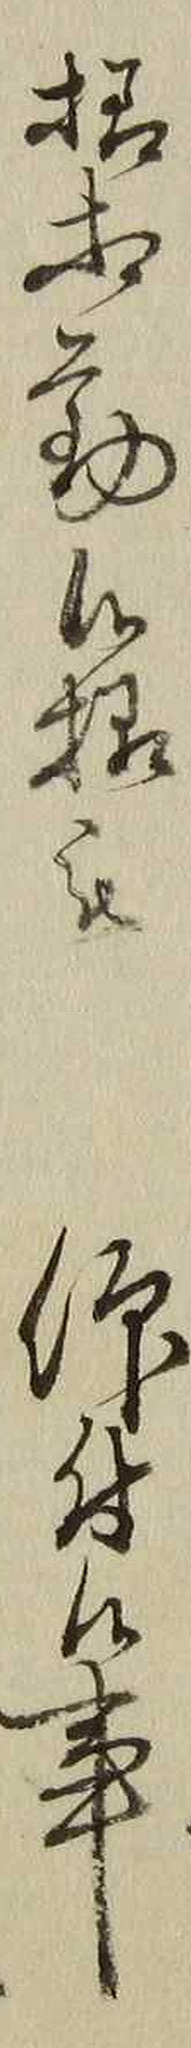様相勤候様被仰付候事
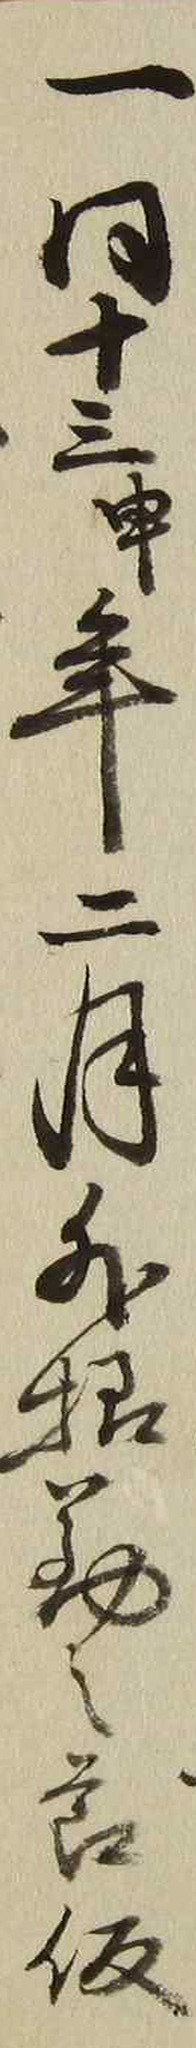一同十三申年二月外様勤之節仮
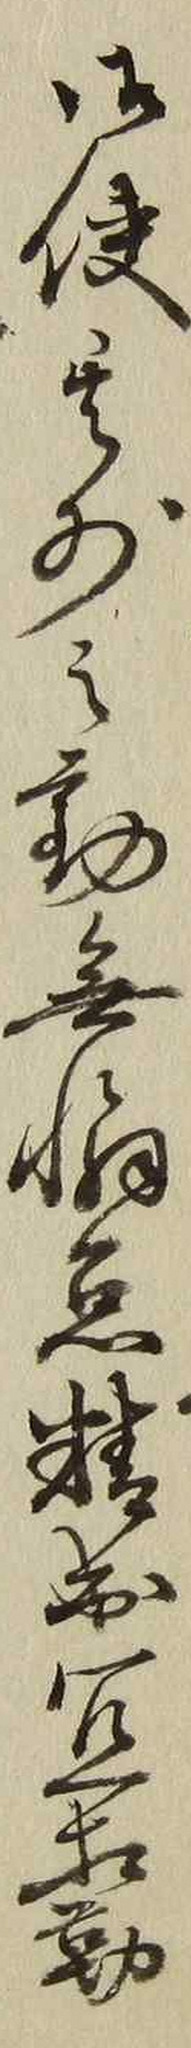御使其外之勤無懈怠精出宜相勤
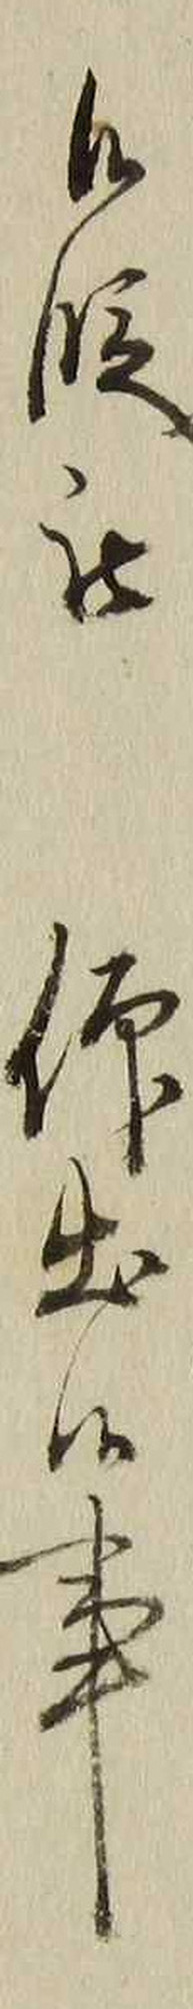候段被仰出候事
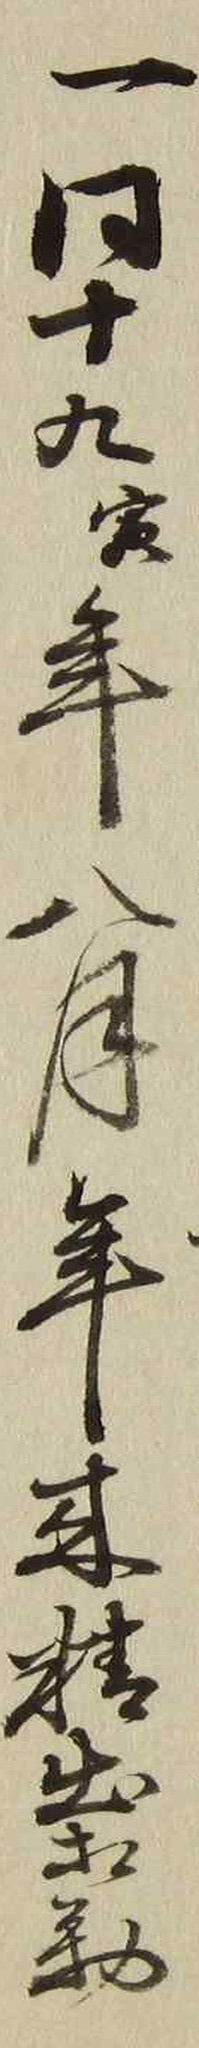一同十九寅年八月年来精出相勤
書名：諸士系譜　巻之35　は之部3
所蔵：会津若松市立会津図書館
